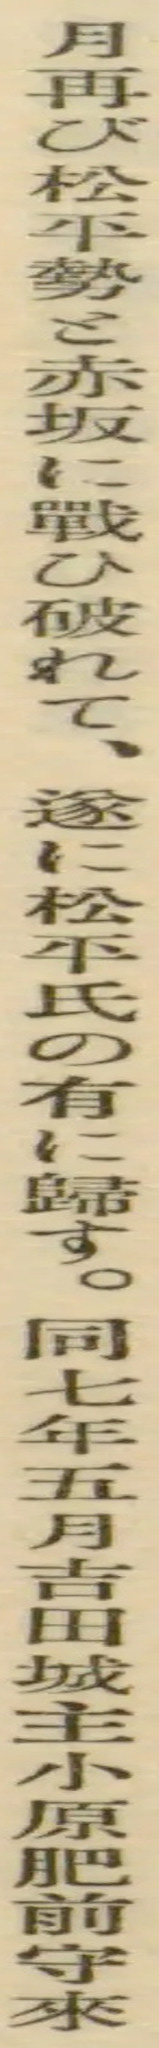月再び松平勢と赤坂に戦ひ破れて、遂に松平氏の有に帰す。同七年五月吉田城主小原肥前守来
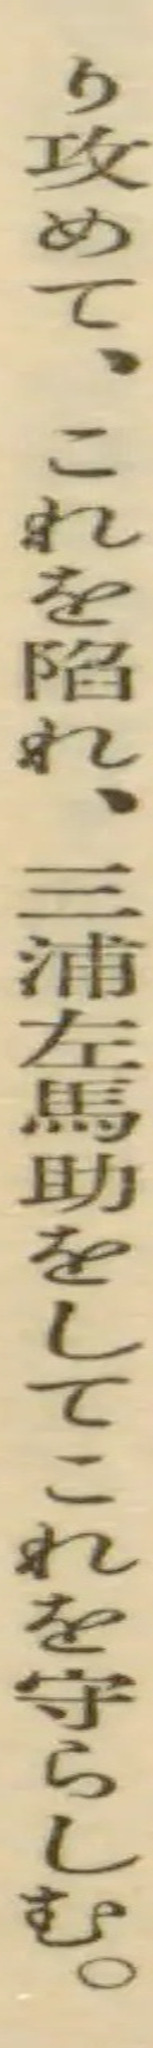り攻めて、これを陥れ、三浦左馬助をしてこれを守らしむ。

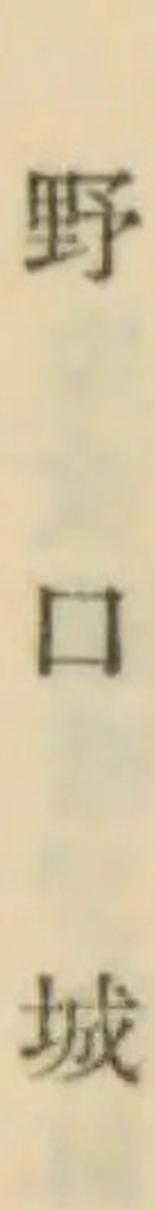野口城
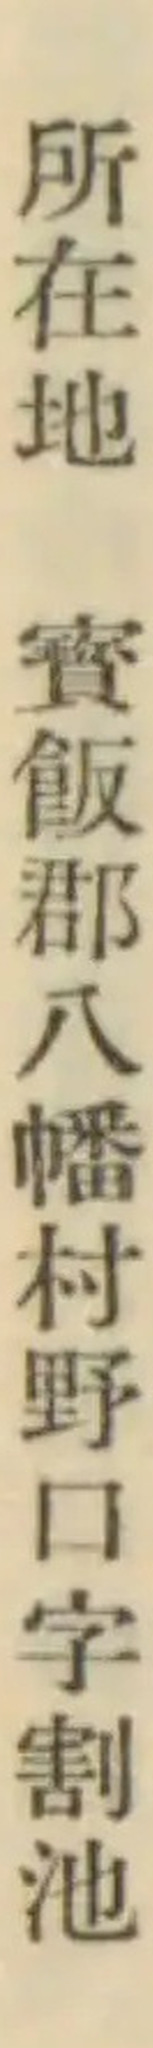所在地宝飯郡八幡村野口字割池
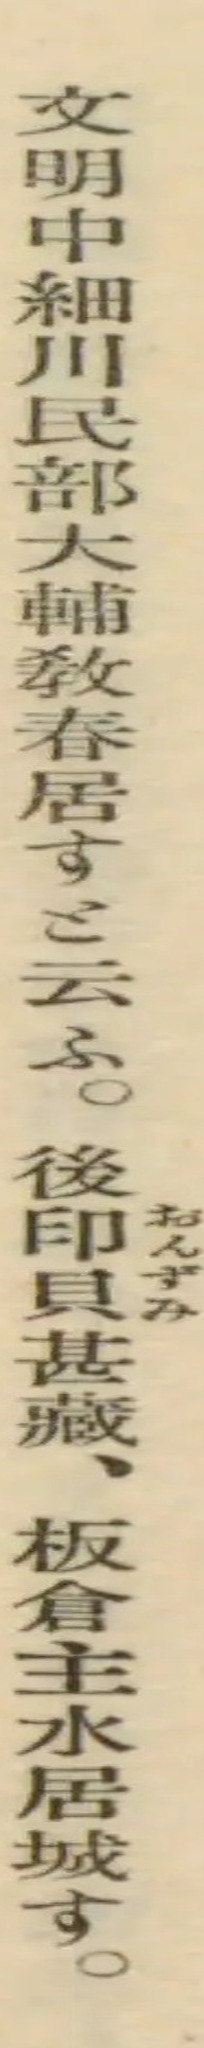文明中細川民部大輔教春居すと云ふ。後印貝甚蔵、板倉主水居城す。
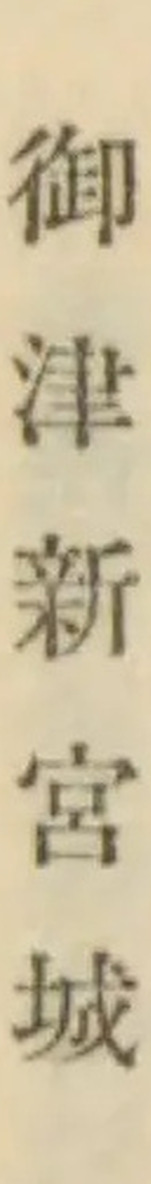御津新宮城
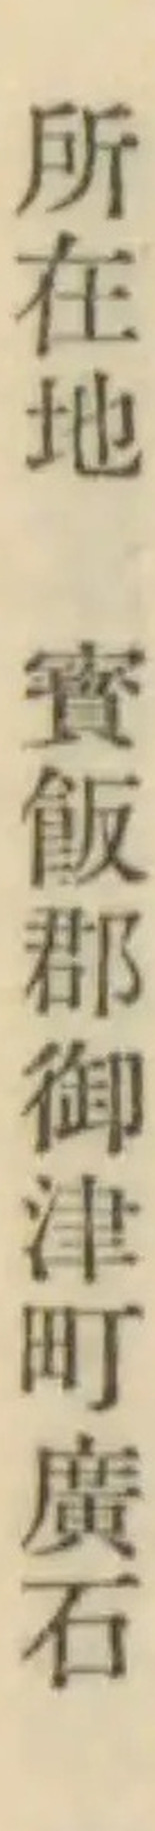所在地宝飯郡御津町廣石
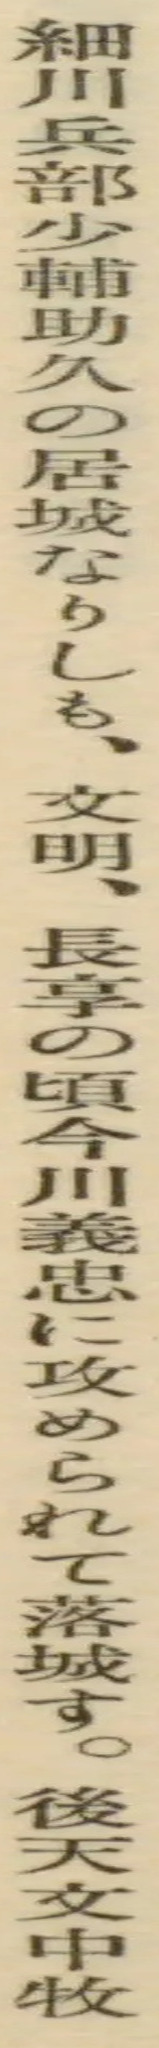細川兵部少輔助久の居城なりしも、文明、長享の頃今川義忠に攻められて落城す。後天文中牧
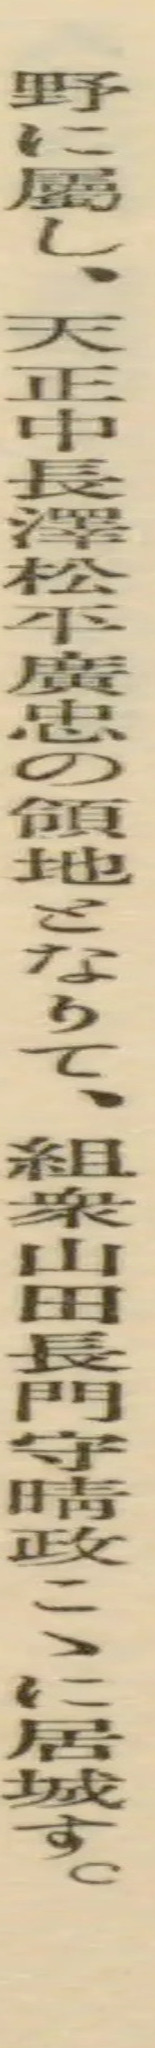野に属し、天正中長沢松平広忠の領地となりて、組衆山田長門守晴政こゝに居城す。
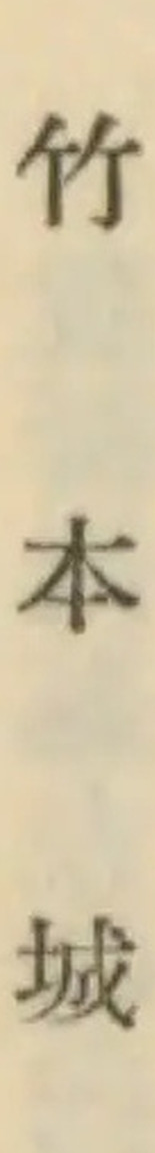竹本城
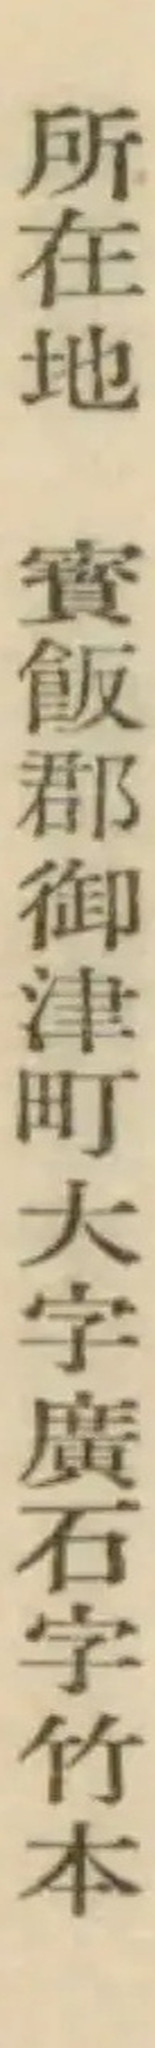所在地宝飯郡御津町大字廣石字竹本
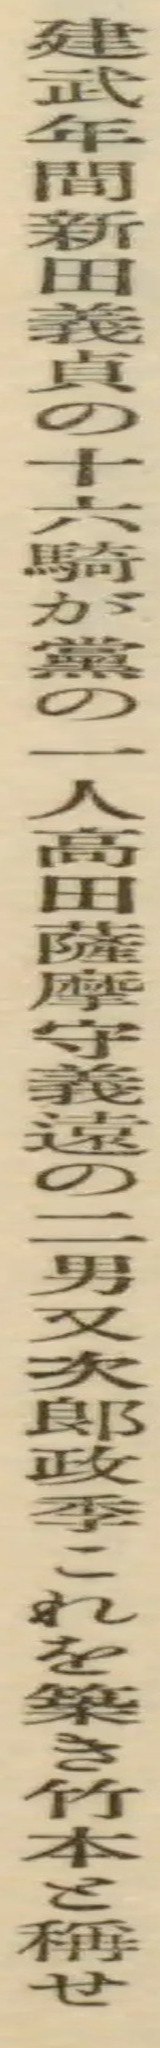建武年間新田義貞の十六騎が党の一人高田薩摩守義遠の二男又次郎政季これを築き竹本と称せ
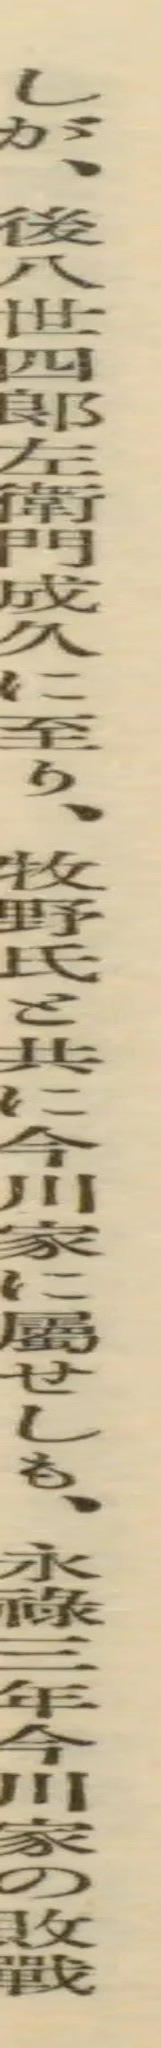しが、後八世四郎左衛門成久に至り、牧野氏と共に今川家に属せしも、永禄三年今川家の敗戦
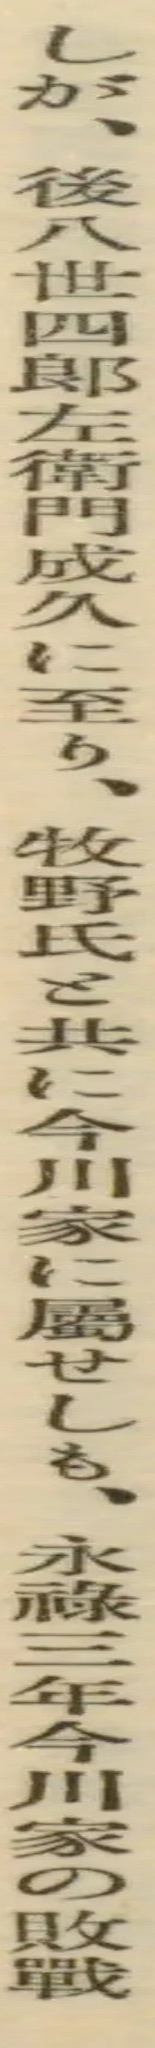しが、後八世四郎左衛門成久に至り、牧野氏と共に今川家に属せしも、永禄三年今川家の敗戦
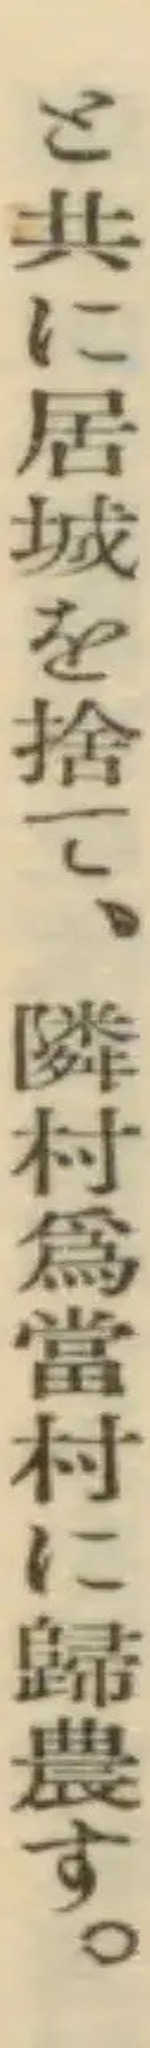と共に居城を捨て、隣村為当村に帰農す。
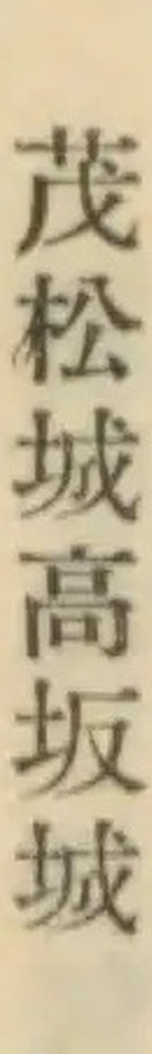茂松城高坂城
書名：東三河之古城
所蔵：国立国会図書館 National Diet Library, JAPAN
